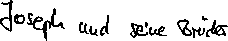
Joseph und seine Brüder
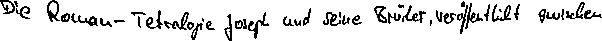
Die Roman-Tetralogie Joseph und seine Brüder, veröffentlicht zwischen
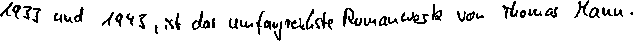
1933 und 1943, ist das umfangreichste Romanwerk von Thomas Mann.
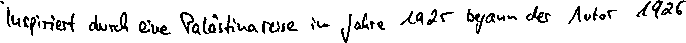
Inspiriert durch eine Palästinareise im Jahr 1925 begann der Autor 1926
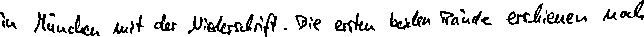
In München mit der Niederschrift. Die ersten beiden Bände erschienen noch
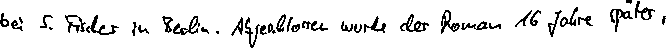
bei S. Fischer in Berlin. Abgeschlossen wurde der Roman 16 Jahre später,
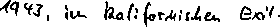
1943, im kalifornischen Exil
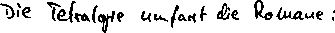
Die Tetralogie umfasst die Romane:
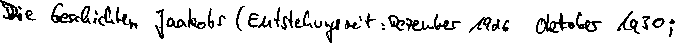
Die Geschichten Jaakobs (Entstehungszeit: Dezember 1926 Oktober 1930;
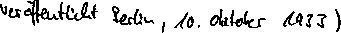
veröffentlicht Berlin, 10. Oktober 1933)
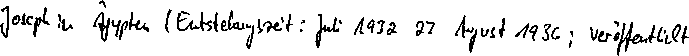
Joseph in Ägypten (Entstehungszeit: Juli 1932 23. August 1936; veröffentlicht
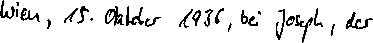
Wien, 15. Oktober 1936, bei Joseph, der
